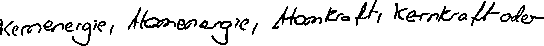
Kernenergie, Atomenergie, Atomkraft, Kernkraft oder
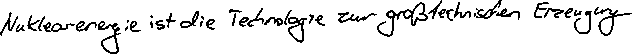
Nuklearenergie ist die Technologie zur großtechnischen Erzeugung
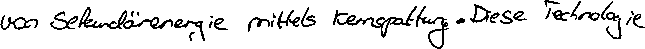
von Sekundärenergie mittels Kernspaltung. Diese Technologie
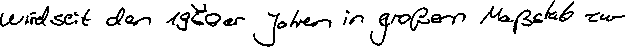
wird seit den 1950er Jahren in großem Maßstab zur
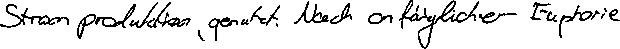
Stromproduktion genutzt. Nach anfänglicher Euphorie
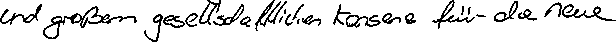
und großem gesellschaftlichen Konsens für die neue
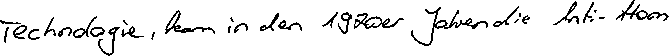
Technologie, kam in den 1970er Jahren die Anti-Atom
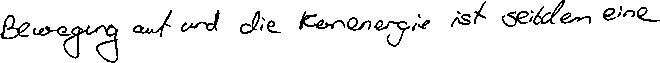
Bewegung auf und die Kernenergie ist seitdem eine
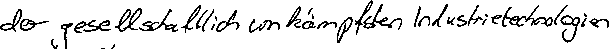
der gesellschaftlich umkämpftesten Industrietechnologien
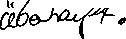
überhaupt.
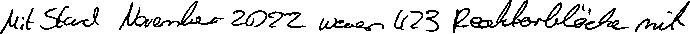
Mit Stand November 2022 waren 423 Reaktorblöcke mit
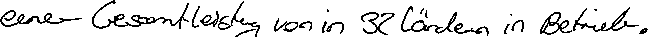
einer Gesamtleistung von in 32 Ländern in Betrieb.
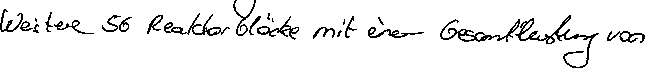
Weitere 56 Reaktorblöcke mit einer Gesamtleistung von
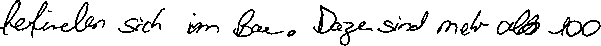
befinden sich in Bau. Dazu sind mehr als 100
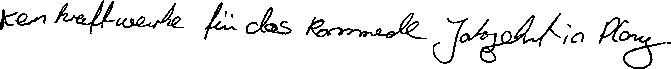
Kernkraftwerke für das kommende Jahrzehnt in Planung.
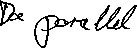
Da parallel
